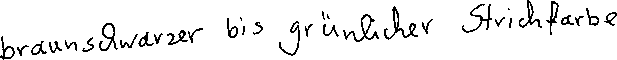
braunschwarzer bis grünlicher Strichfarbe
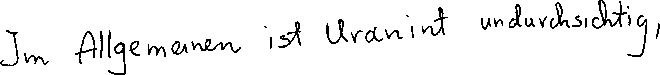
Im Allgemeinen ist Uraninit undurchsichtig,
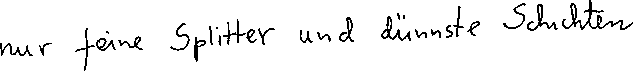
nur feine Splitter und dünnste Schichten
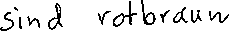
sind rotbraun
